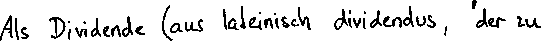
Als Dividende (aus lateinisch dividendus, "der zu
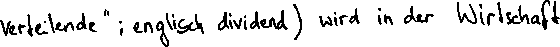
verteilende";englisch dividend) wird in der Wirtschaft
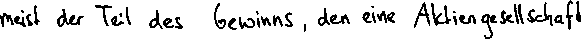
meist der Teil des Gewinns, den eine Aktiengesellschaft
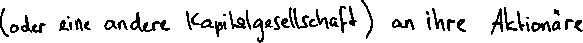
(oder eine andere Kapitalgesellschaft) an ihre Aktionäre
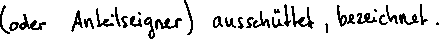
(oder Anteilseigner) ausschüttet, bezeichnet.
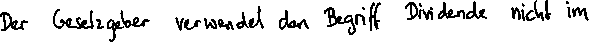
Der Gesetzgeber verwendet den Begriff Dividende nicht im
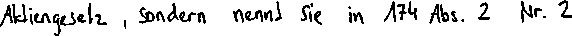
Aktiengesetz, sondern nennt sie in 174 Abs. 2 Nr. 2
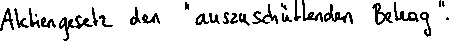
Aktiengesetz den "auszuschüttenden Betrag".
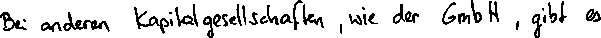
Bei anderen Kapitalgesellschaften, wie der GmbH, gibt es
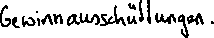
Gewinnausschüttungen.
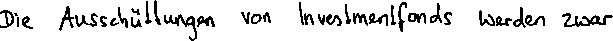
Die Ausschüttungen von Investmentfonds werden zwar
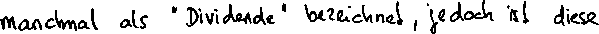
manchmal als "Dividende" bezeichnet, jedoch ist diese
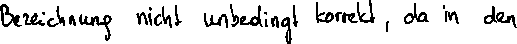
Bezeichnung nicht unbedingt korrekt, da in den
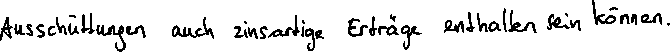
Ausschüttungen auch zinsartige Erträge enthalten sein können.
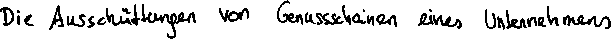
Die Ausschüttungen von Genussscheinen eines Unternehmens
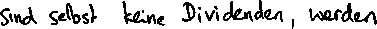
sind selbst keine Dividenden, werden
